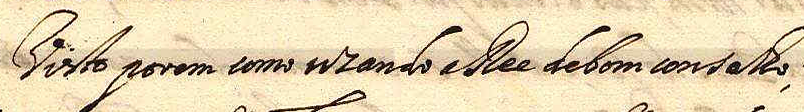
Visto porem como uzando a Ree de bom conselho,
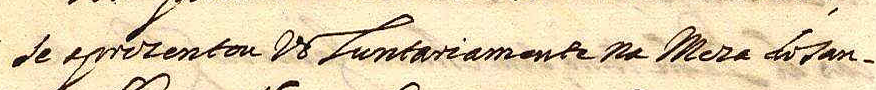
se aprezentou voluntariamente na Meza do san
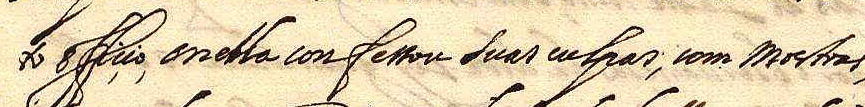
to officio, e nella confessou suas culpas, com mostras,
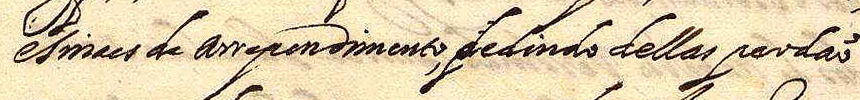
e sinaes de arrependimento, pedindo dellas perdaõ
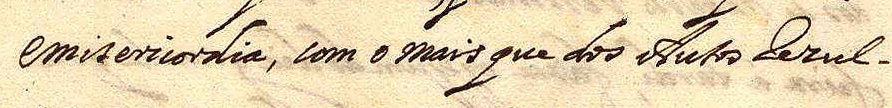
e misericordia, com o mais que dos Autos Rezul
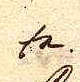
ta.
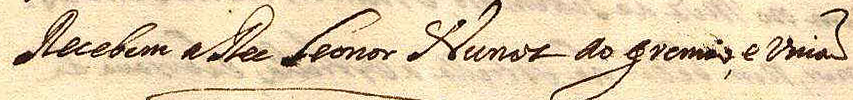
Recebem a Ree Leonor Nunez ao gremio, e uniaõ
